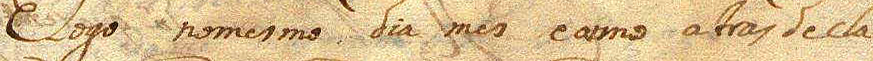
E Logo no mesmo dia mes e anno atras decla
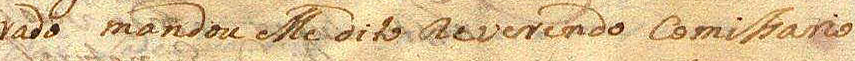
rado mandou elle dito Reverendo Comissario
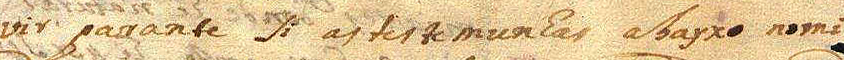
vir parante si as testemunhas abayxo nomi
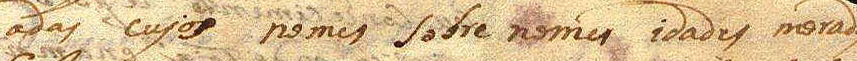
adas cujos nomes sobrenomes idades morada_
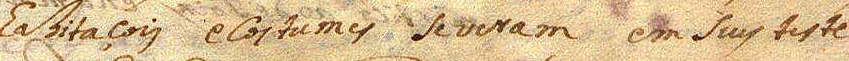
habitaçois e costumes se ueram em seus teste
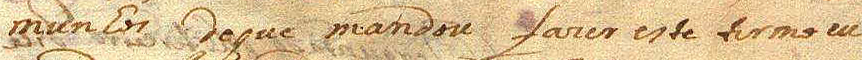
munhos de que mandou fazer este termo eu
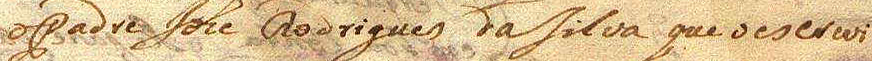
o Padre Joze Rodrigues da Silva que o escrevi
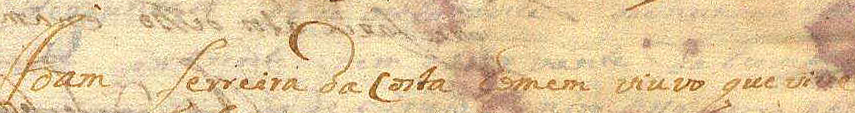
Joam ferreira da Costa homem uiuvo que uive
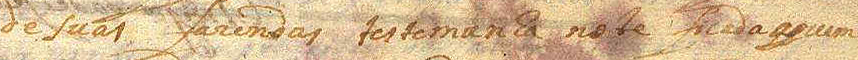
de suas fazendas testemunha noteficada a quem
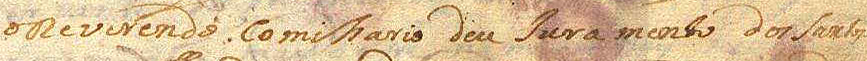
o Reverendo Comissario deu Iuramento dos Santos
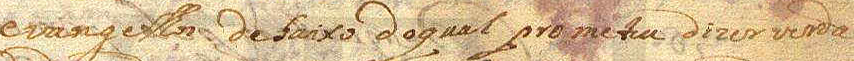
evangelhos debaixo do qual prometeu dizer verda
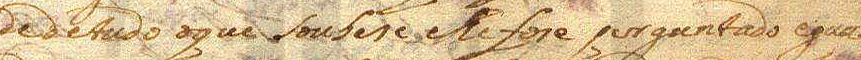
de de tudo o que soubese e lhe fose perguntado e gua
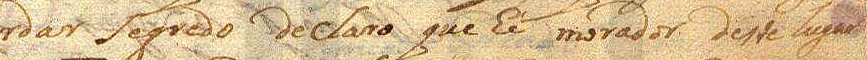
rdar segredo declaro que hé morador deste lugar
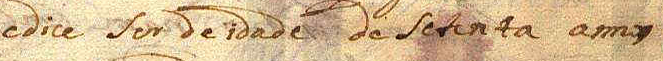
e dice ser de idade de setenta annos
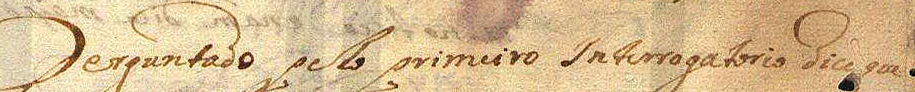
Perguntado pelo primeiro Interrogatorio dice que
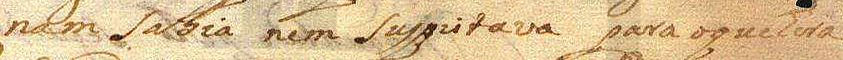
nam sabia nem suspeitava para o que hera
